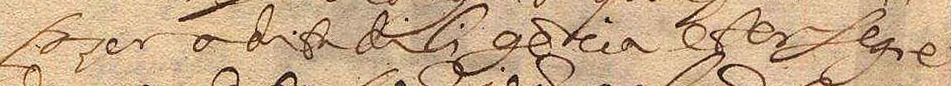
fazer a dita diligēcia e ter segre
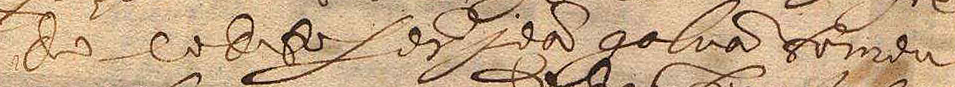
do e o dito sor̄ joaõ galuaõ tomou
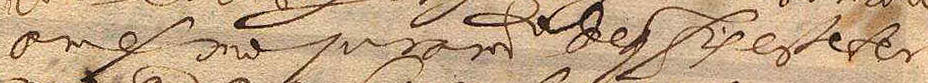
o mesmo juramto de q̄ fis este ter
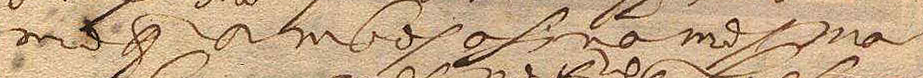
mo q̄ ambos asinamos ma
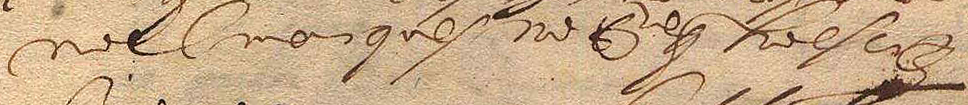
noel marques notro q̄ ho escrj̄
